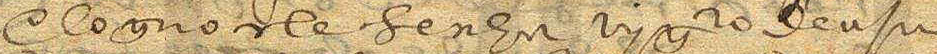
e loguo ele senhor vygro deu Ju
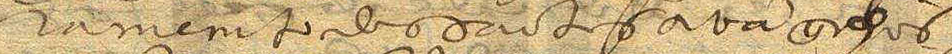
ramemto dos saõtos avāgelhos
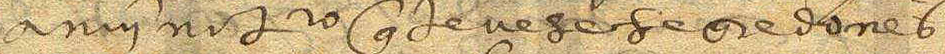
a mȳ notro q̄ teuese segredo nes
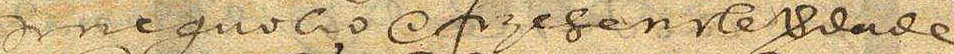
te neguocio e fizese nele ꝟdade
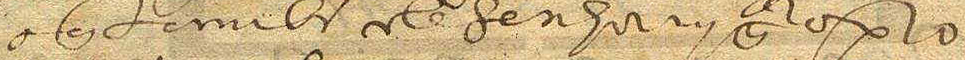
o q̄ tambē ele senhor ujgro pro
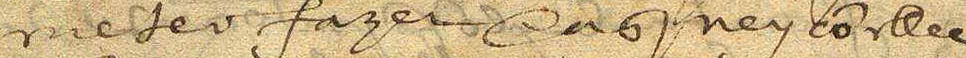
meteo fazer e asjney cō ellee
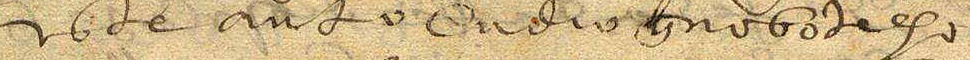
este auto eu dioguo botelho
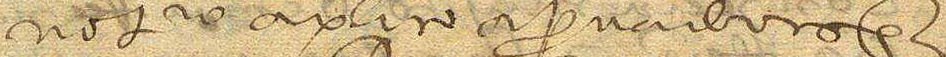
notro aplico aꝓuado o esp̄j
